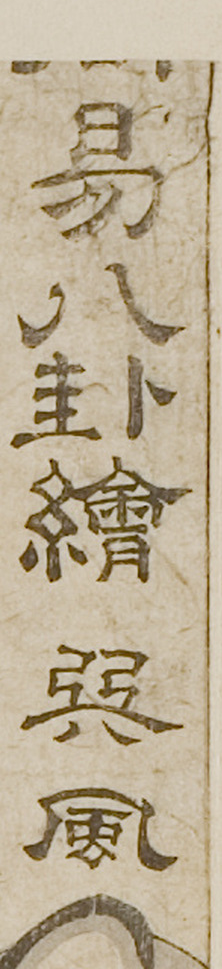易八卦絵巽風
